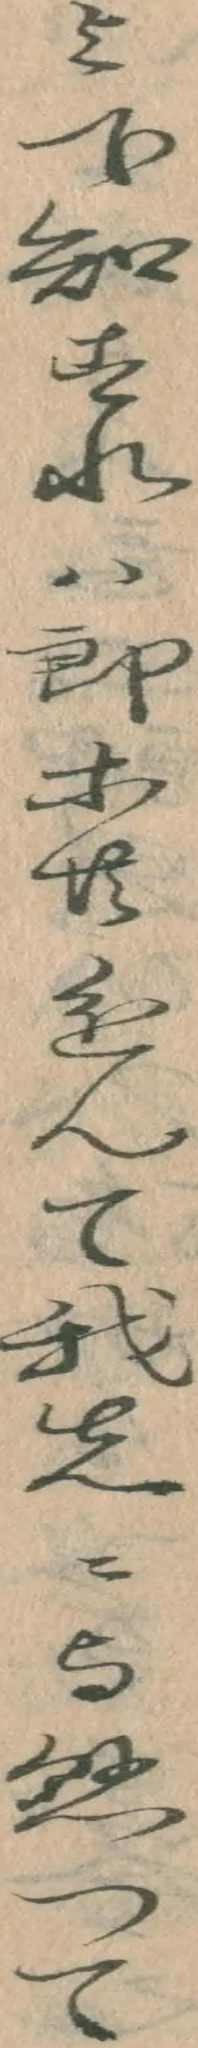与下知春れは郎等共進んて我先に与懸つて
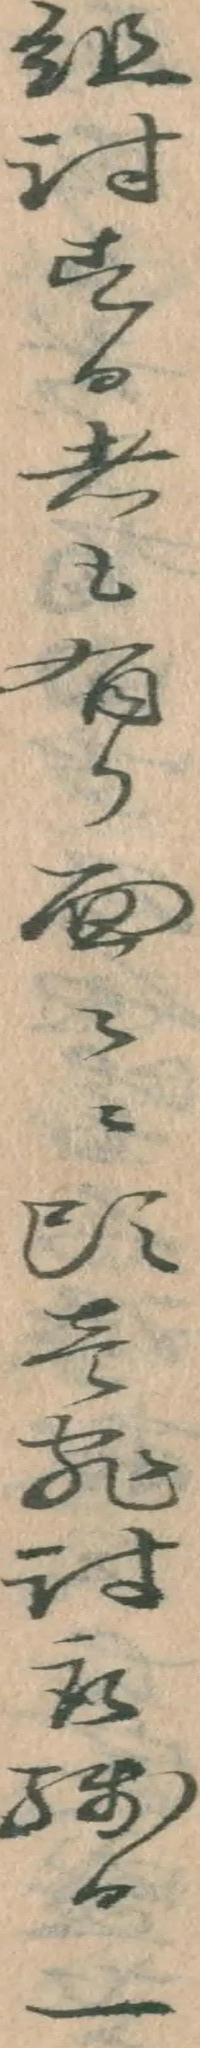組討春る者も有り面々に頭壱究討取残る一
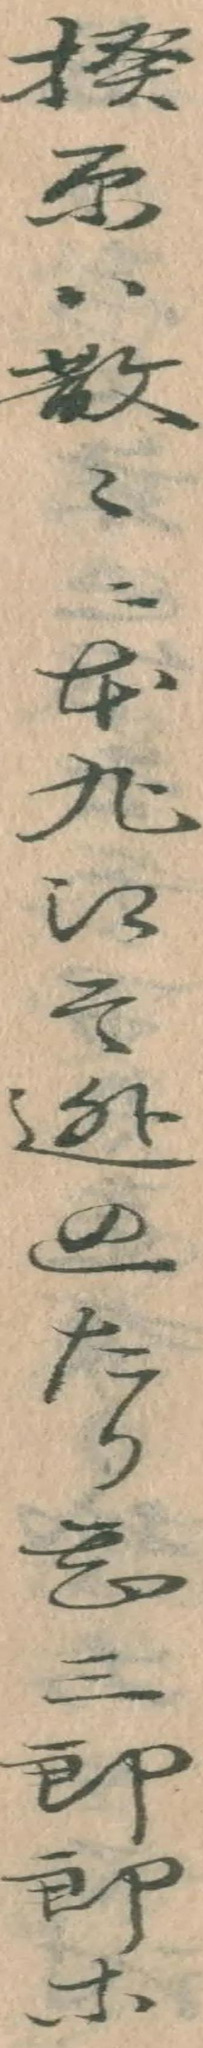揆原は散々に本丸江そ逃込たり甚三郎郎等
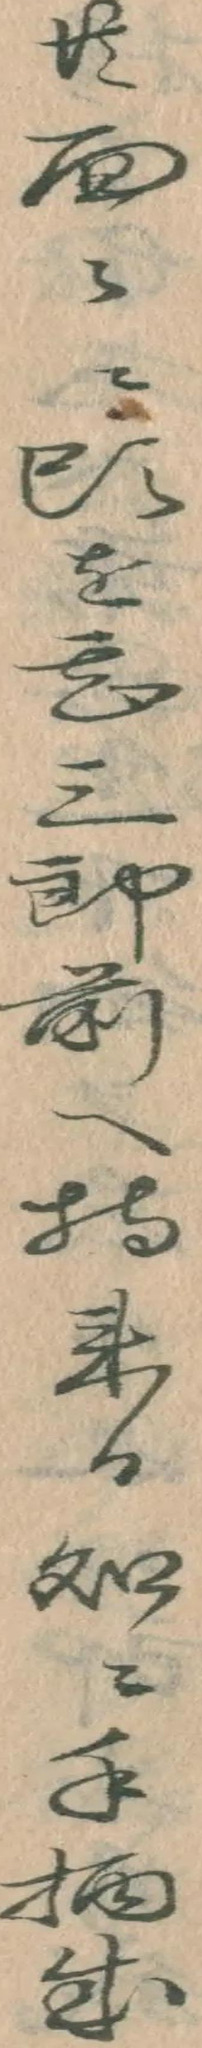共面々に頭を甚三郎前へ持来る処に手柄成
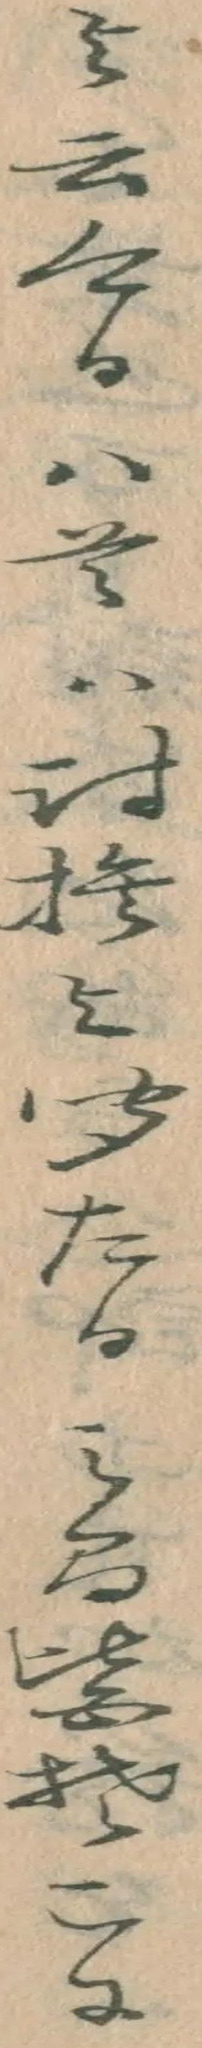与云今日は首は討捨与聞たる之間皆楚こ尓
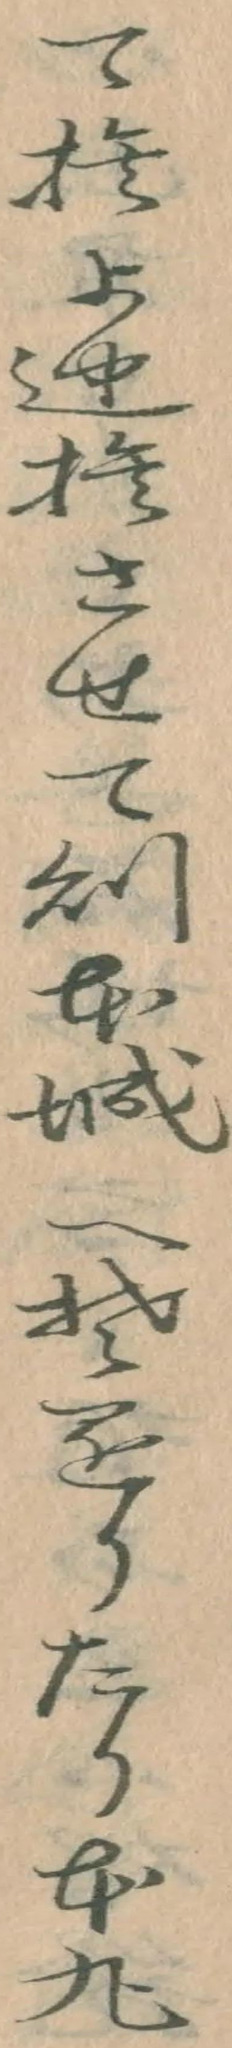て捨よ迚捨させて則本城へ楚懸りたり本丸

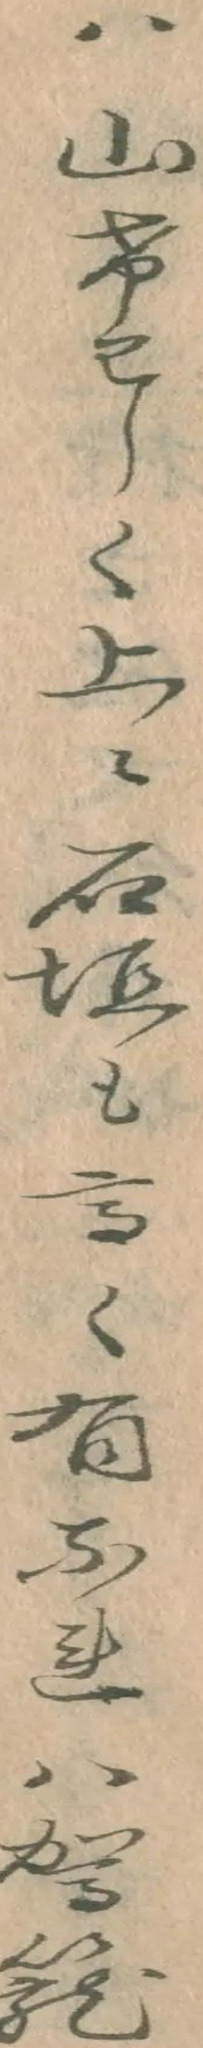は山希已しく上に石垣も高く有な連は駕籠
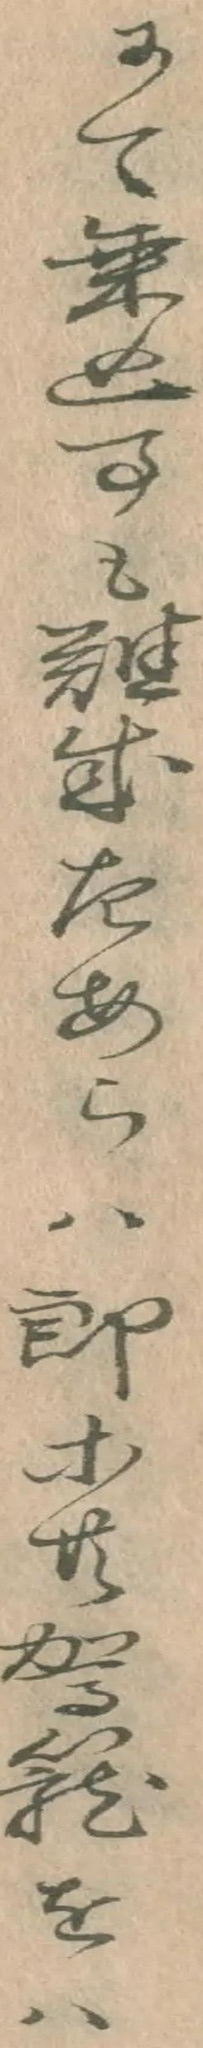尓て乗込事も難成左あらは郎等共駕籠をは
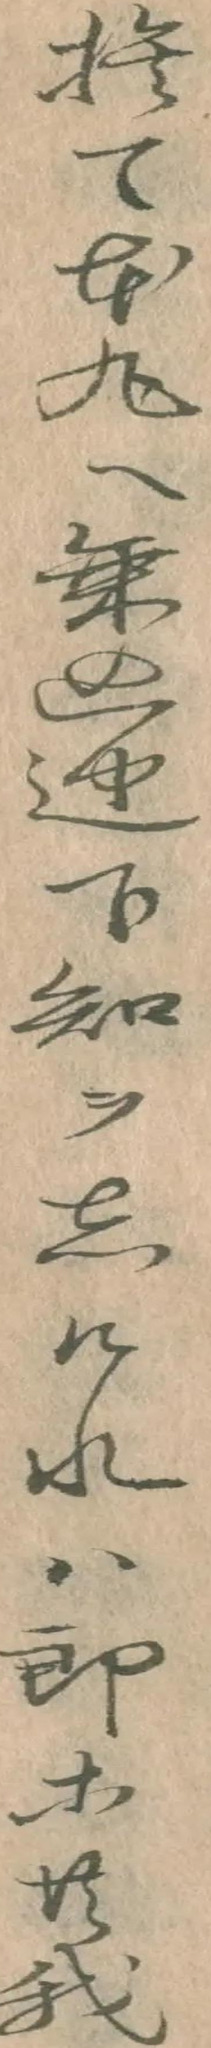捨て本丸へ乗込迚下知を志けれは郎等共我
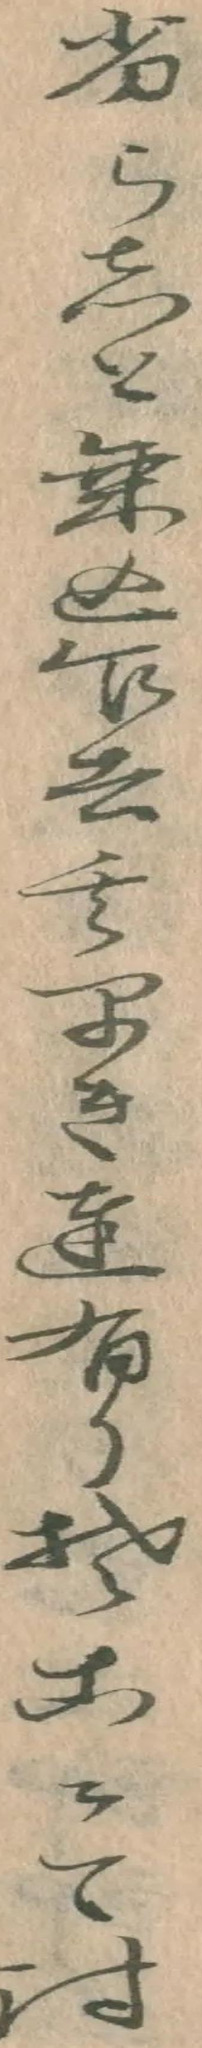劣ら志と乗込乍去其早き達有り楚古にて討
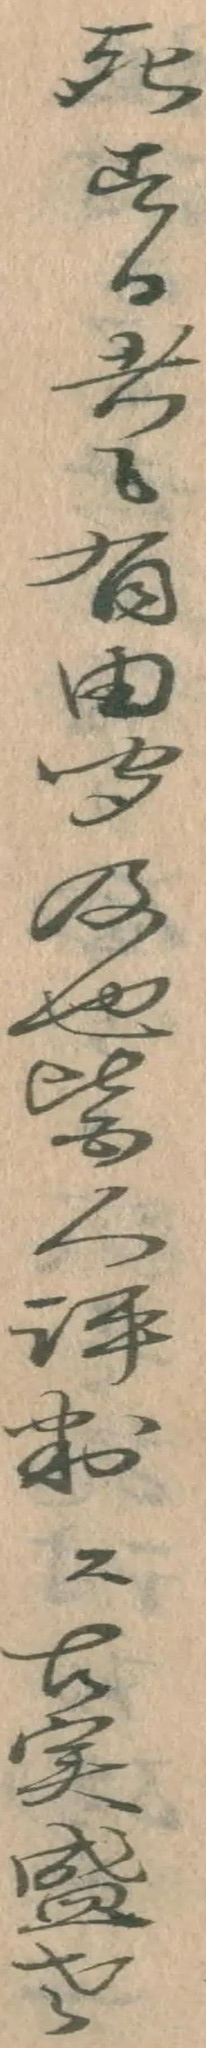死春る者も有由聞及也皆人評判す古実盛さ
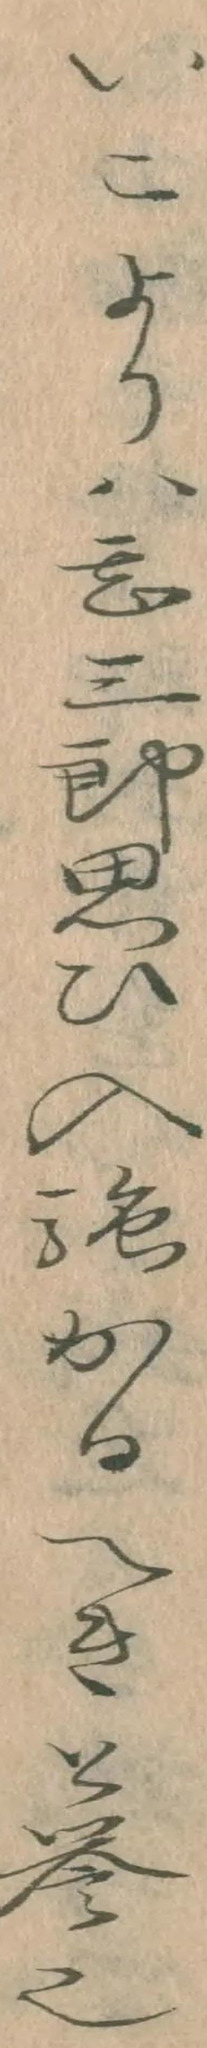いこよりは甚三郎思ひ入強かるへきと誉也
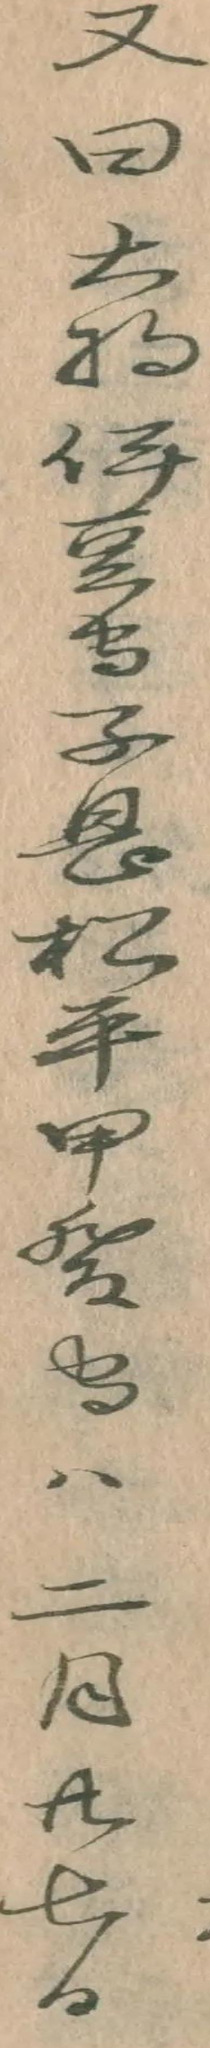又曰大将伊豆守子息松平甲斐守は二月廿七日
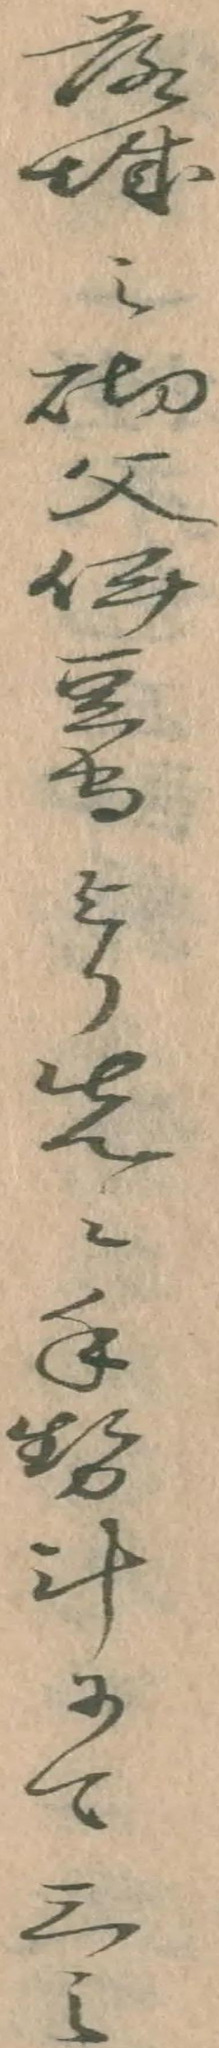落城之砌父伊豆守与り先に手勢斗尓て三之
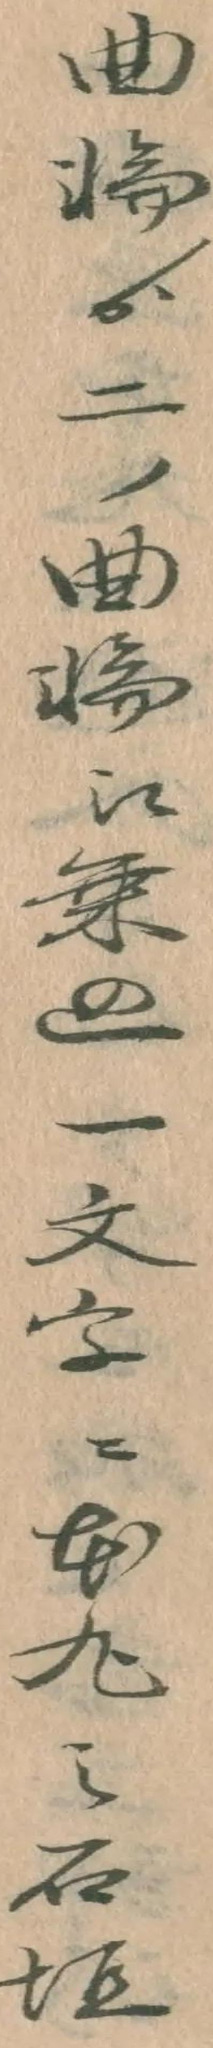曲輪ゟ二之曲輪江乗込一文字に本丸之石垣
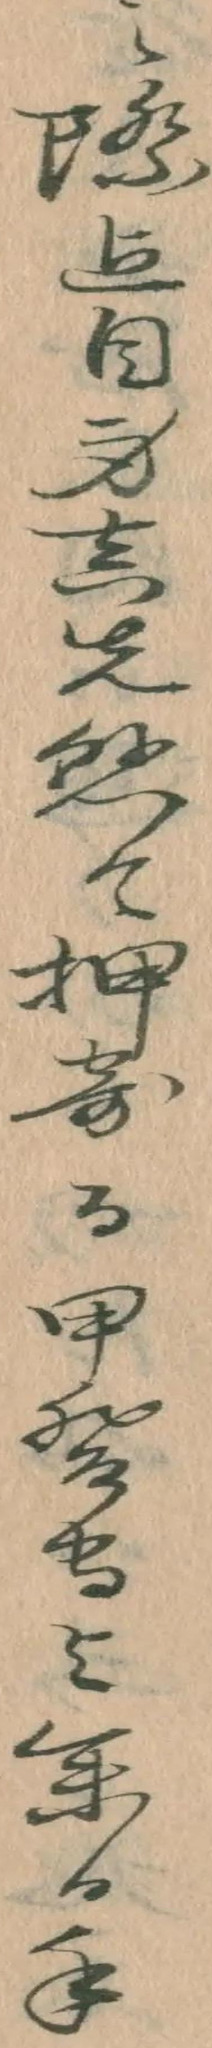之際迄自身真先懸て押寄る甲斐守与参る手
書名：切支丹御退治記 49巻. [8]
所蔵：国立国会図書館 National Diet Library, JAPAN
